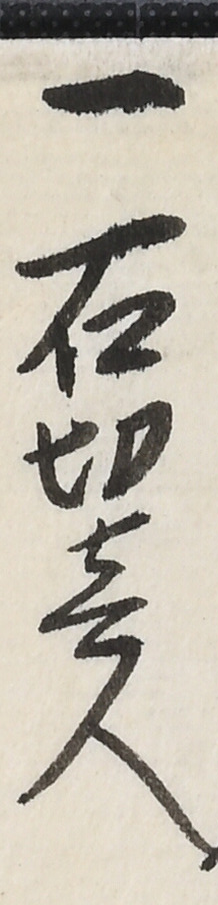一石切壱人
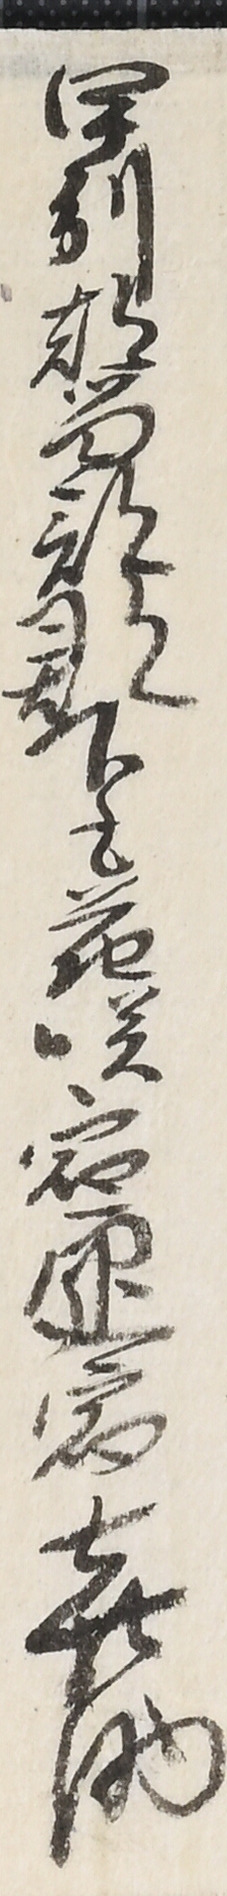甲州都留郡郡下も花咲宿定宿喜助
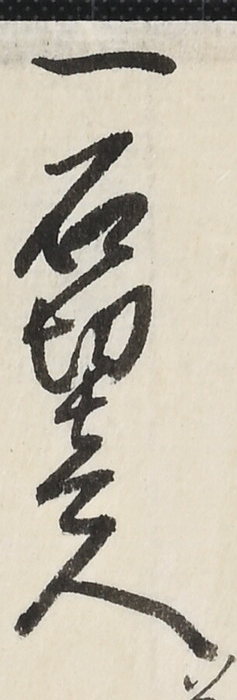一石切壱人
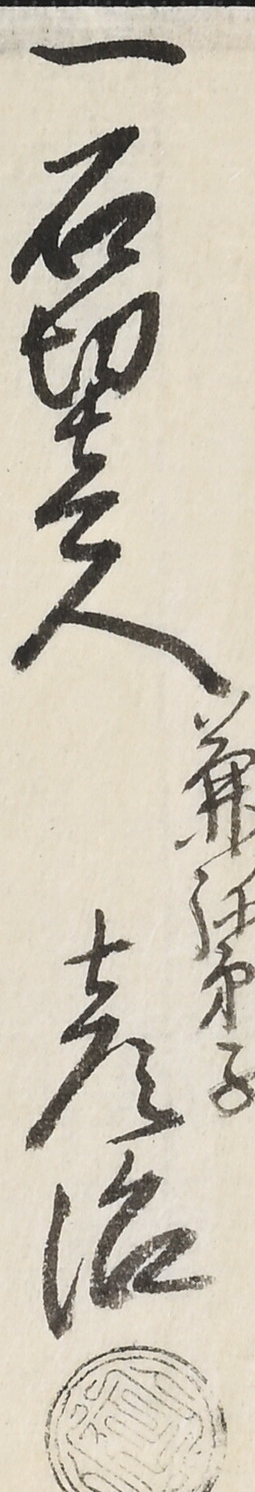一石切壱人金治㊞
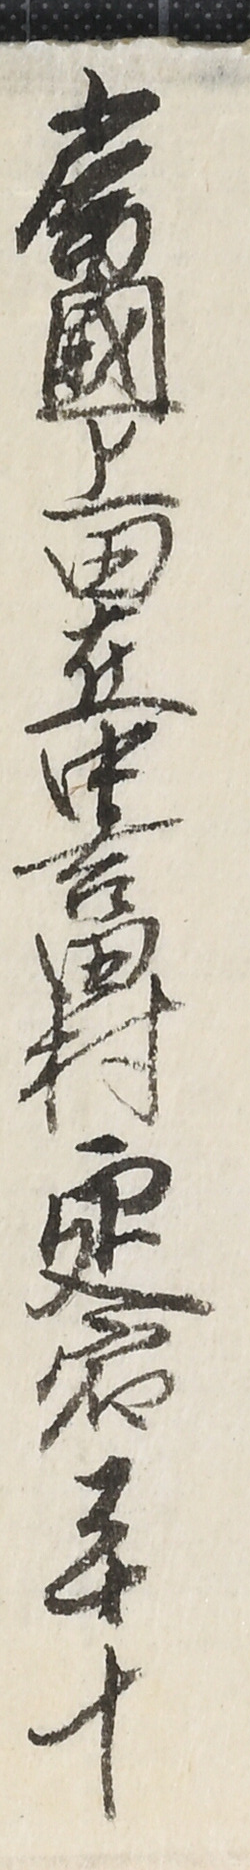当国上田在中吉田村定宿平十
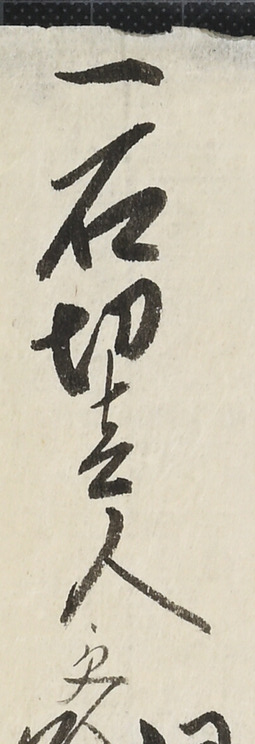一石切壱人
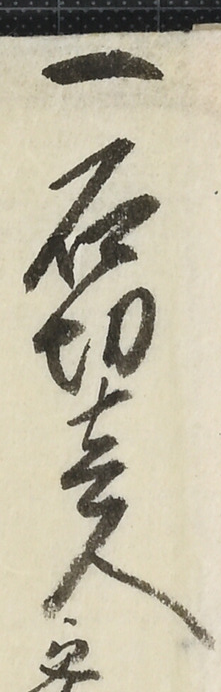一石切壱人
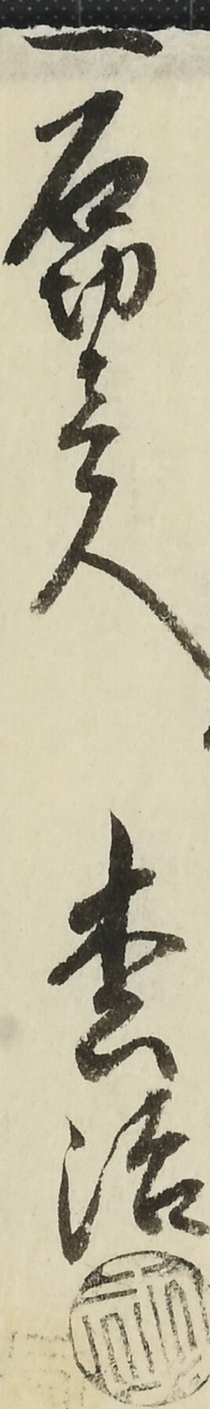一石切壱人金治㊞
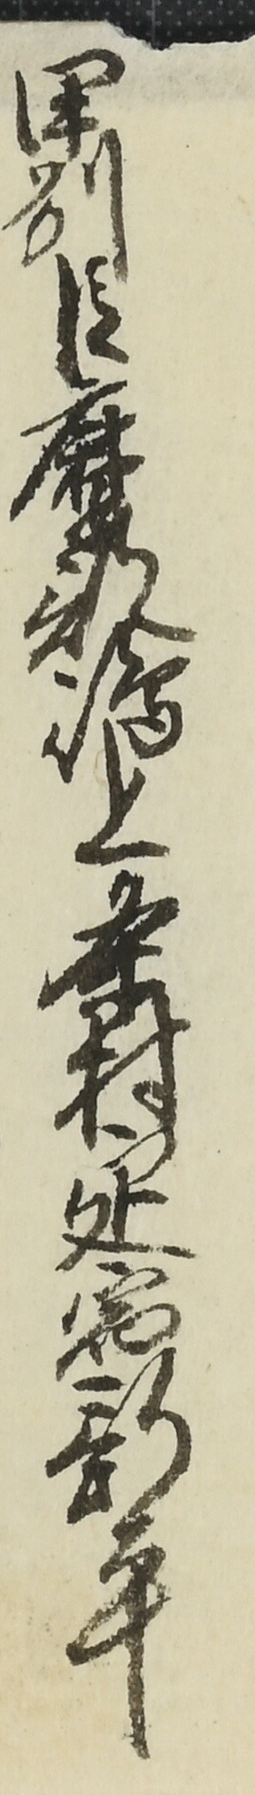甲州巨摩郡島上条村定宿新平

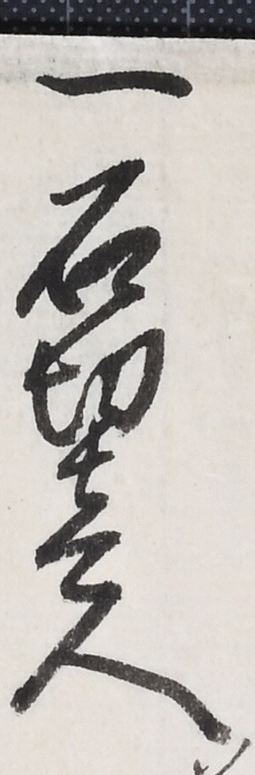一石切壱人
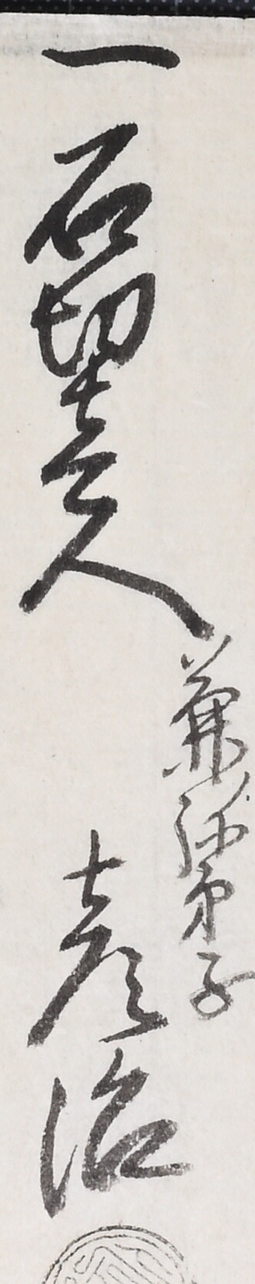一石切壱人松治㊞
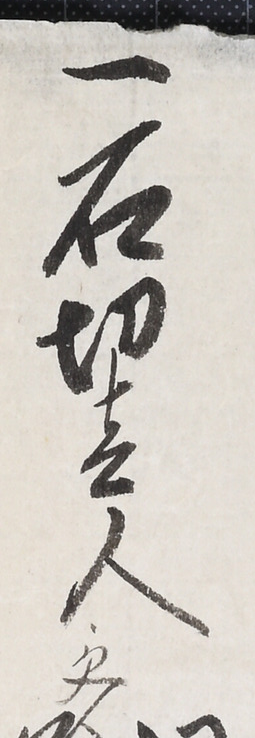一石切壱人
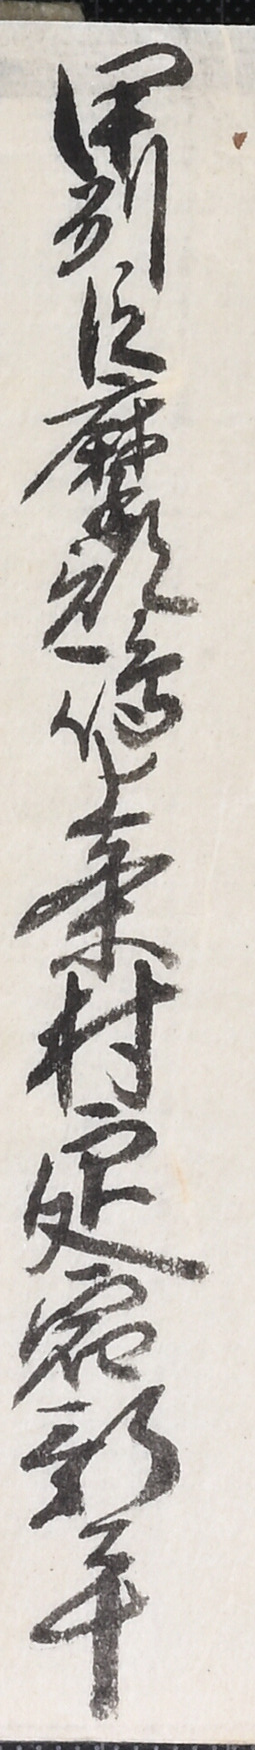甲州巨摩郡島上条村定宿新平
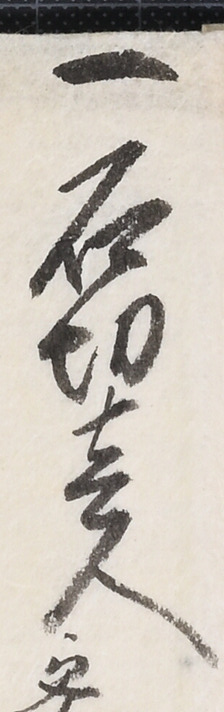一石切壱人
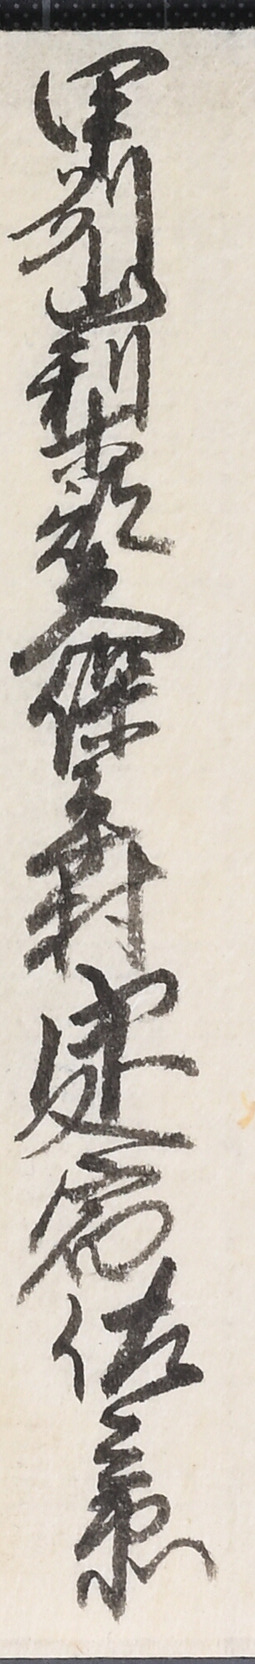甲州山梨郡久保平村定宿佐兵衛
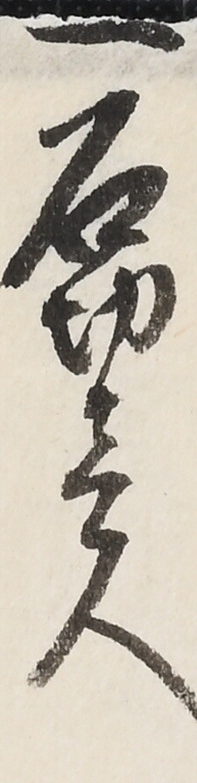一石切壱人
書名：万延二辛酉年正月石切名前書上帳
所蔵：伊那市立高遠町図書館・合同会社AMANE
